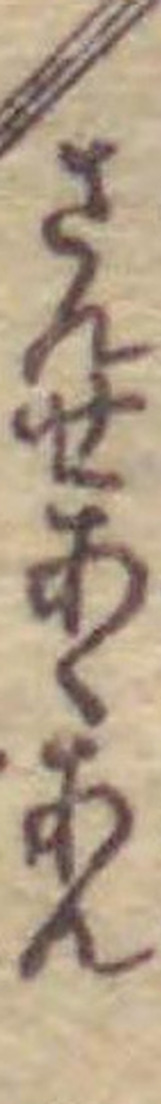さんせあゝあん
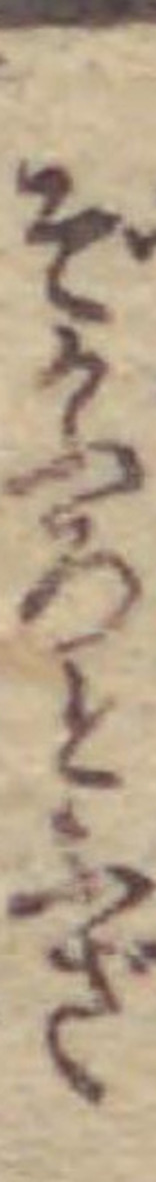ぞかふろとふざ
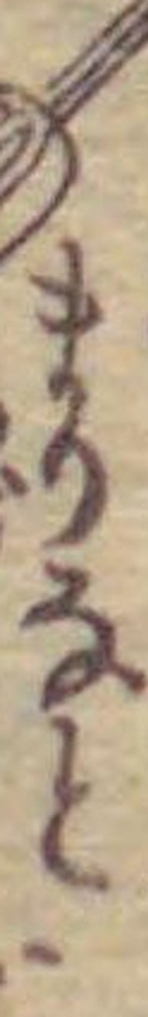まりなと
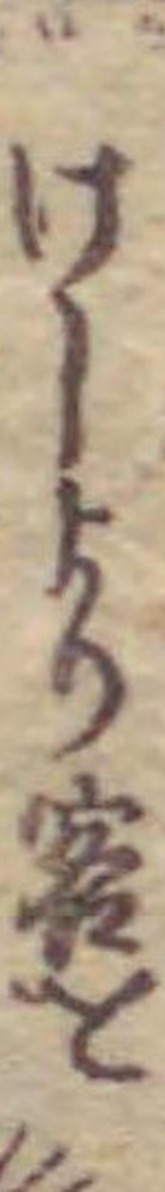けしより客を
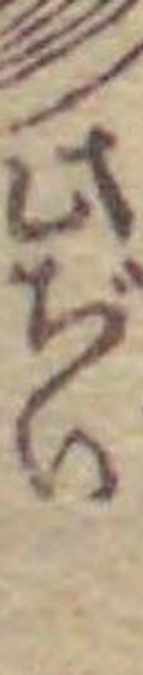此ぢい
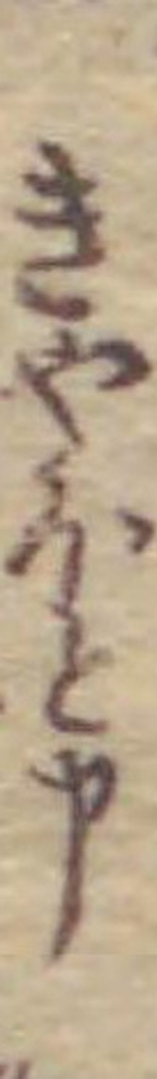きやほと申
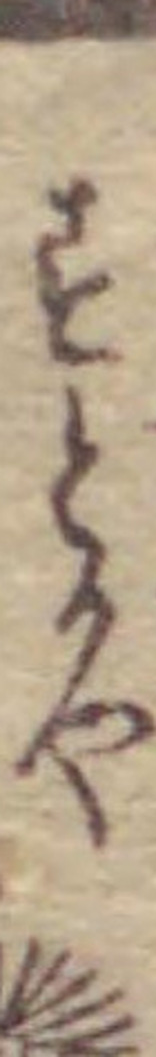すとかや
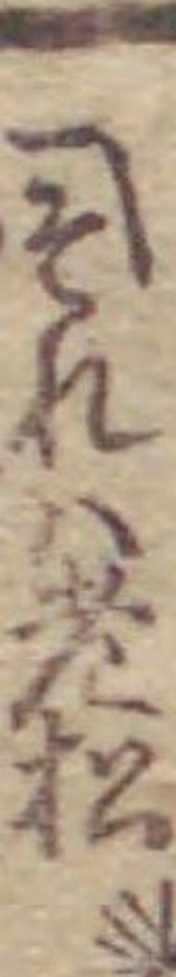〽それは老松
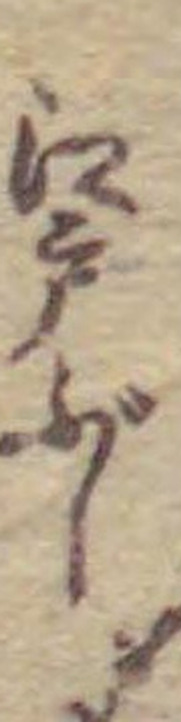江戸ぶし
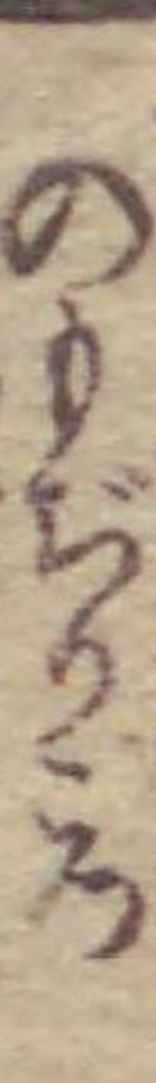のもぢりこつ
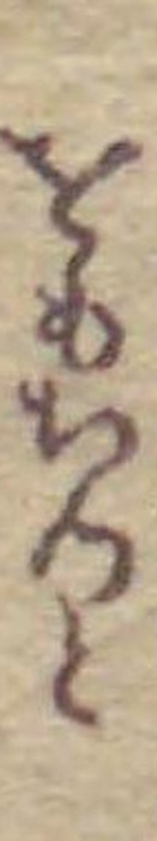をもちつと
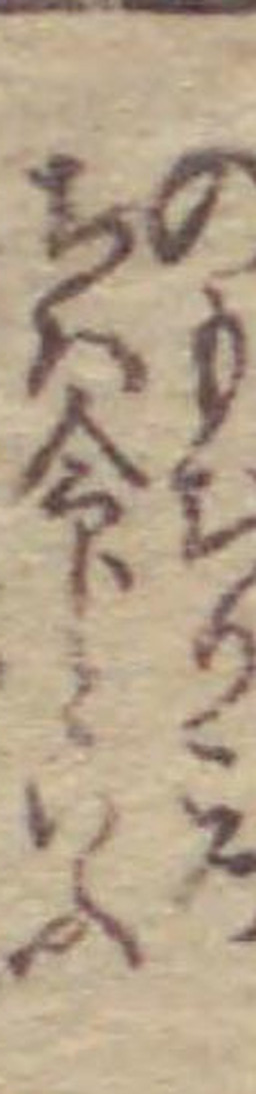ちは命といふ
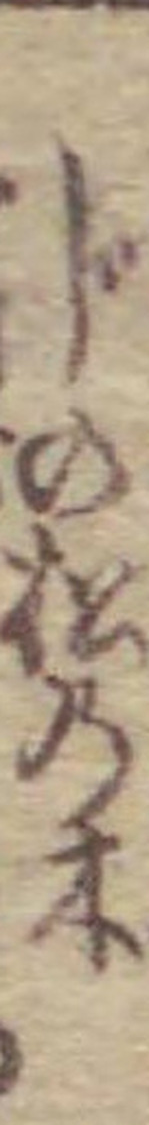じの松の木
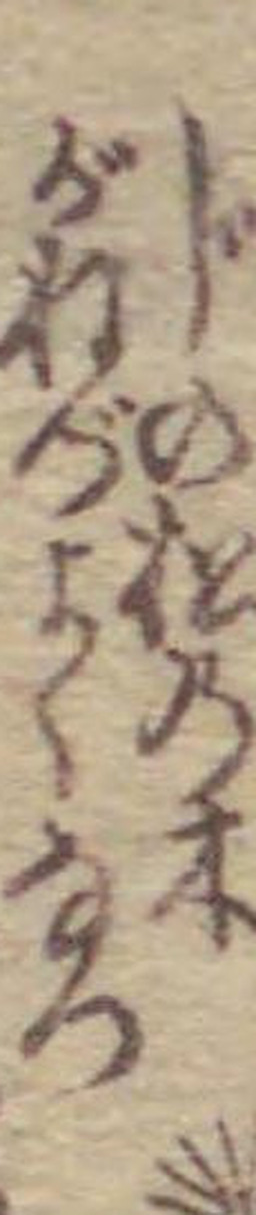がねづよくなつ
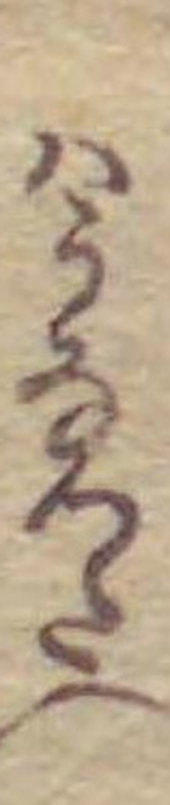はうなつた
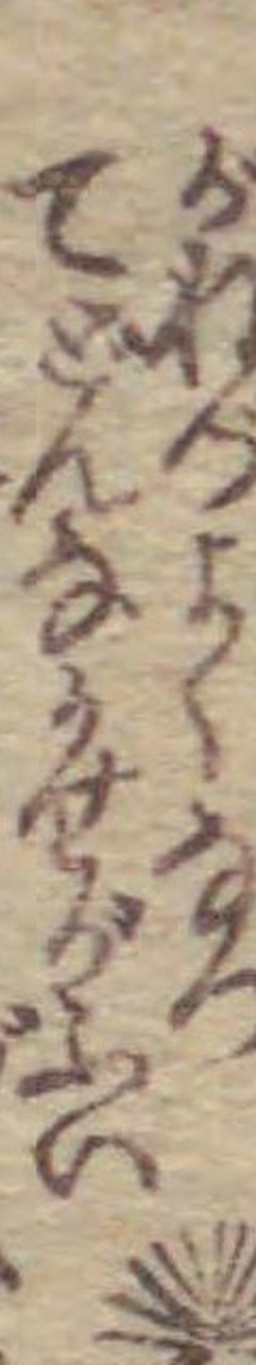てどんなかせがふい
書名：御誂染長寿小紋 : 3巻
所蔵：国立国会図書館 National Diet Library, JAPAN
